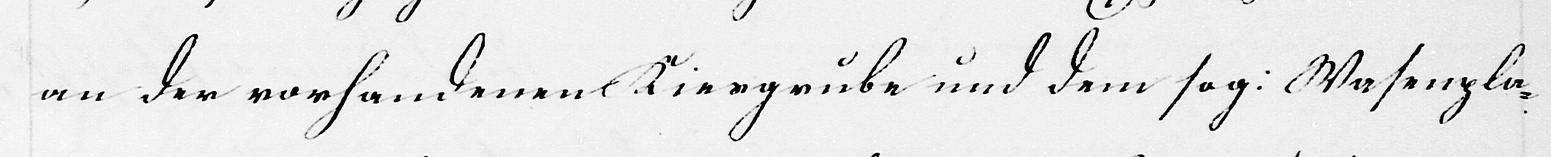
an der vorhandenen Kiesgrube und dem sog: Wasenpla¬
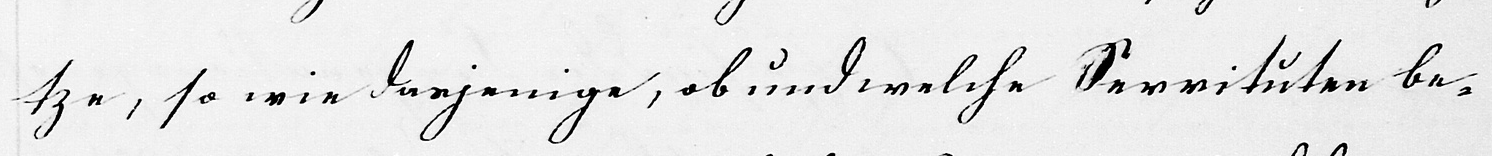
tze, so wie dasjenige, ob und welche Servituten be¬
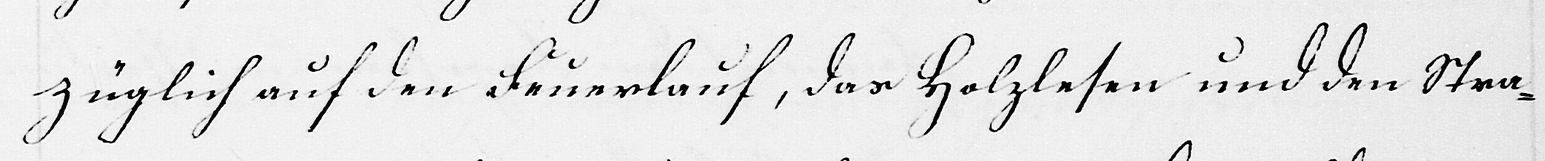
züglich auf den Feuerlauf, das Holzlesen und den Stra¬
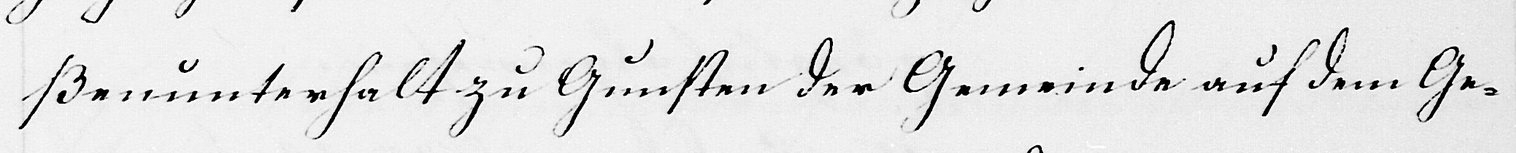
ßenunterhalt zu Gunsten der Gemeinde auf dem Ge¬
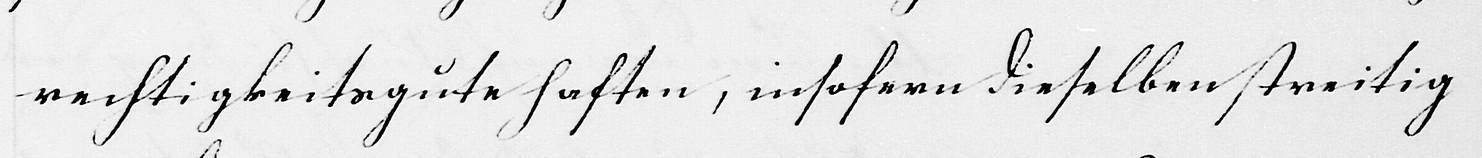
rechtigkeitsgute haften, insofern dieselben streitig
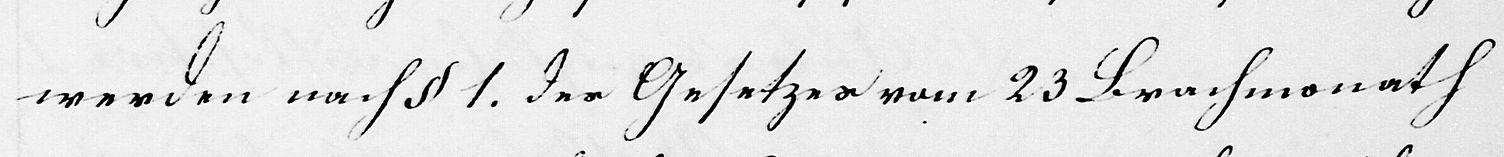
werden nach § 1. des Gesetzes vom 23 Brachmonath
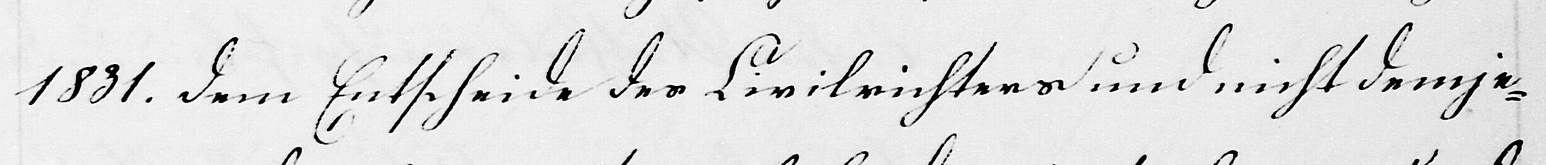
1831. dem Entscheide des Civilrichters und nicht demje¬
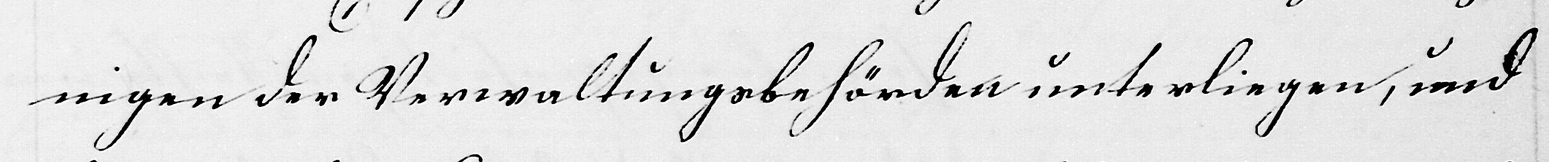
nigen der Verwaltungsbehörden unterliegen, und
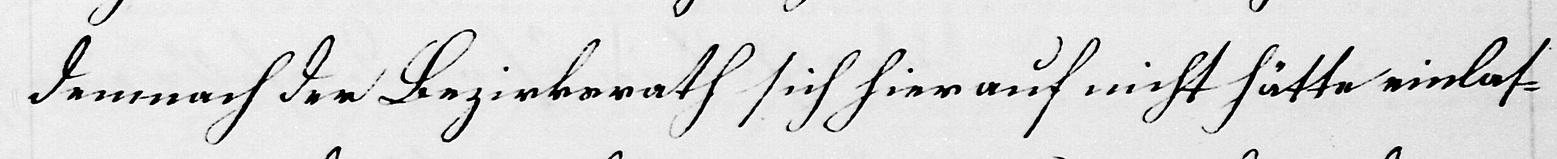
demnach der Bezirksrath sich hierauf nicht hätte einlas¬
